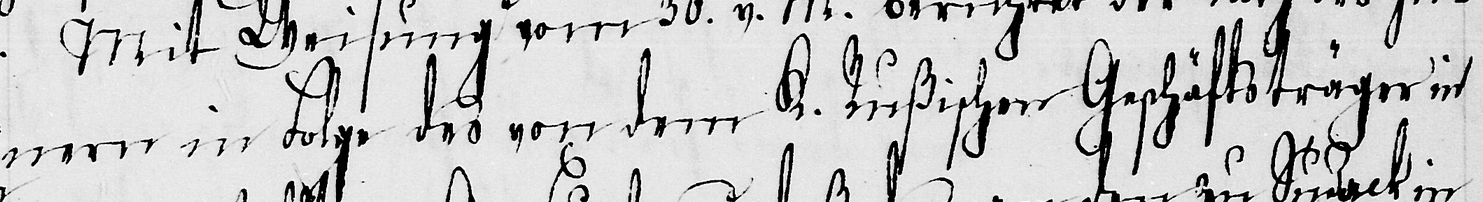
nern in Folge des von dem K. Rußischen Geschäftsträger in
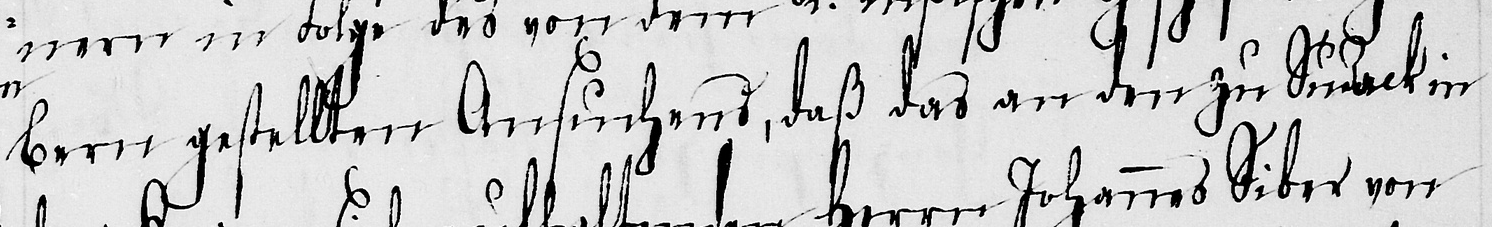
Bern gestellten Ansuchens, daß das an den zu Sudack in
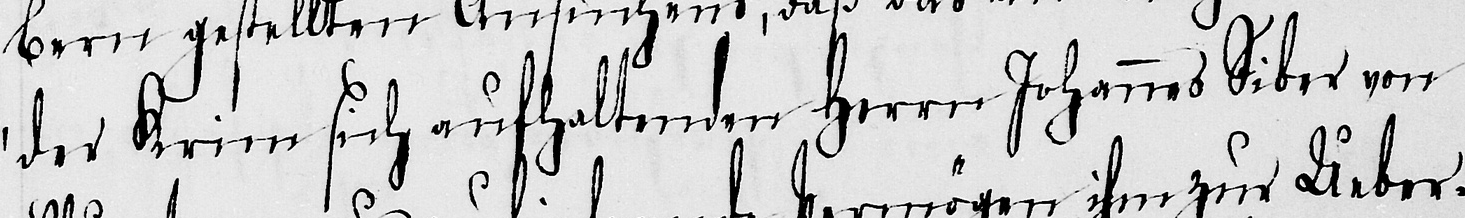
der Krim sich aufhaltenden Herrn Johannes Siber von
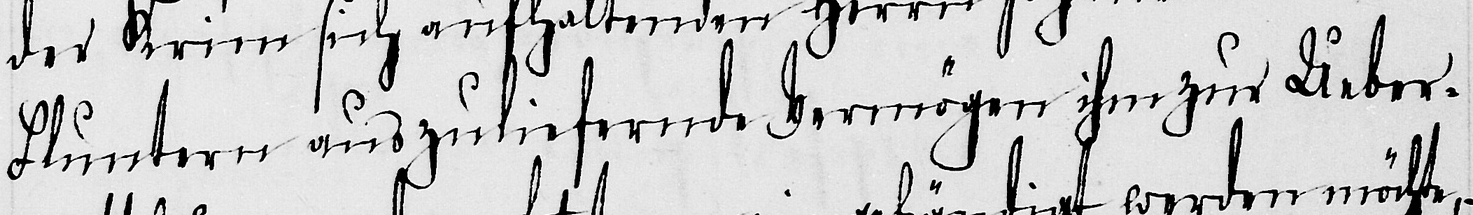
Fluntern auszuliefernde Vermögen ihm zur Ueber¬
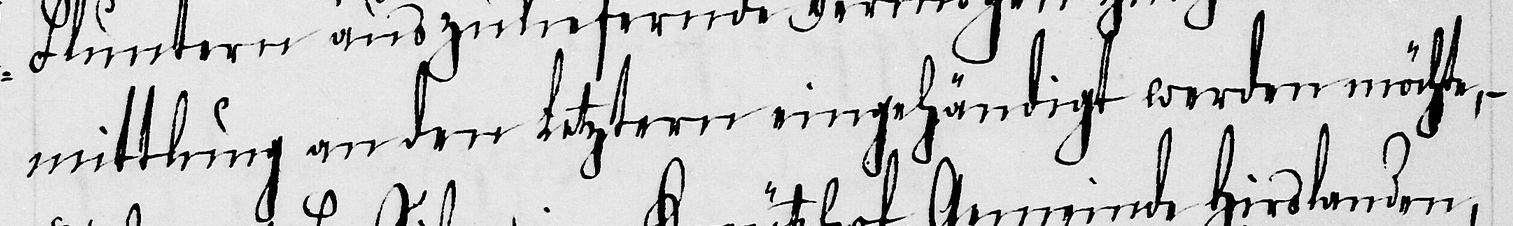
mittlung an den Letztern eingehändigt werden möchte,
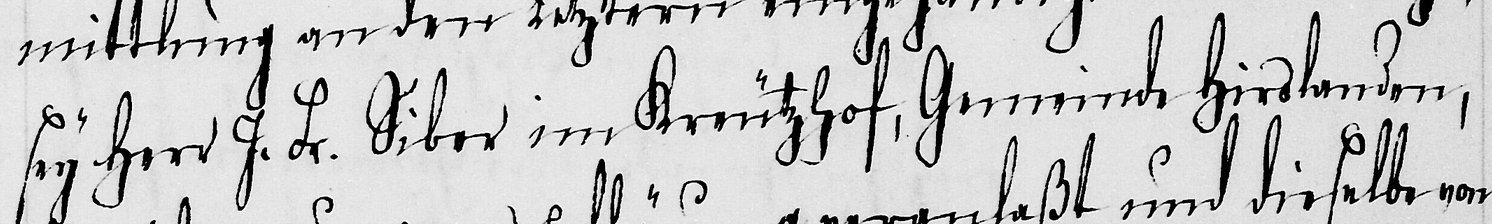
sey Herr J. Fr. Siber im Kreutzhof, Gemeinde Hirslanden,
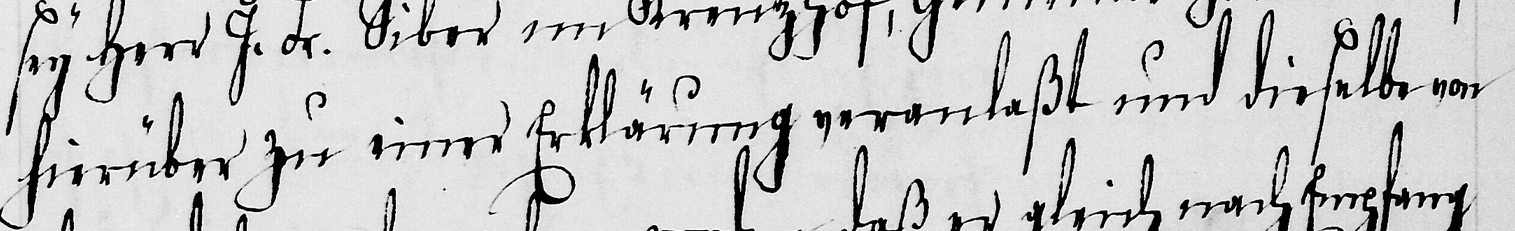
hierüber zu einer Erklärung veranlaßt und dieselbe von
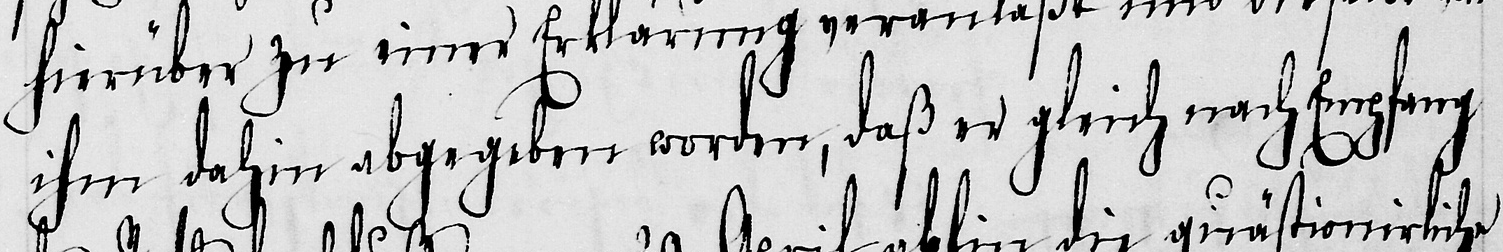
ihm dahin abgegeben worden, daß er gleich nach Empfang
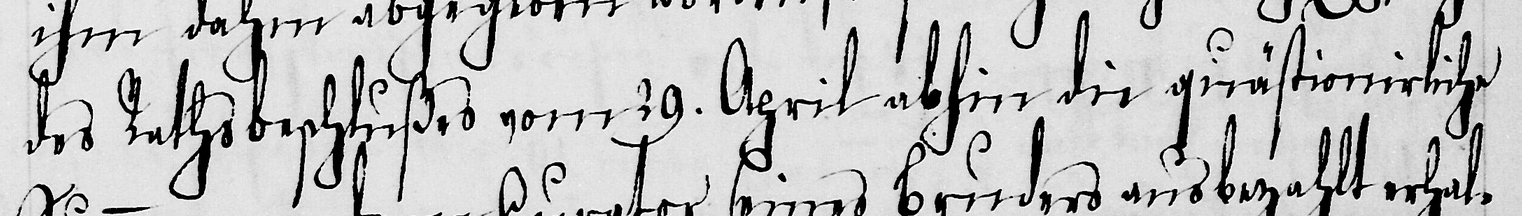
des Rathsbeschlußes vom 29. April abhin die quästionirliche
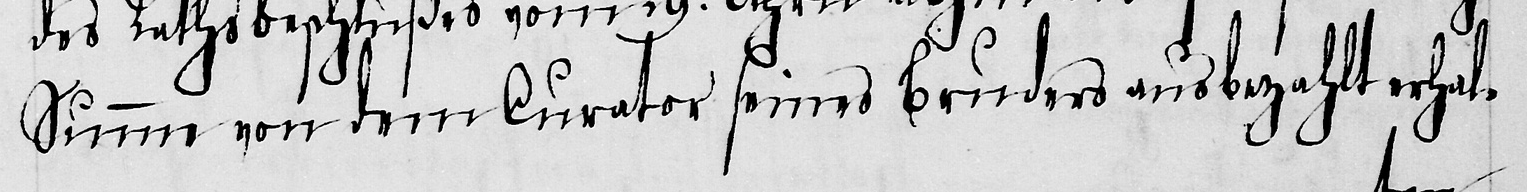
Summe von dem Curator seines Bruders ausbezahlt erhal-
